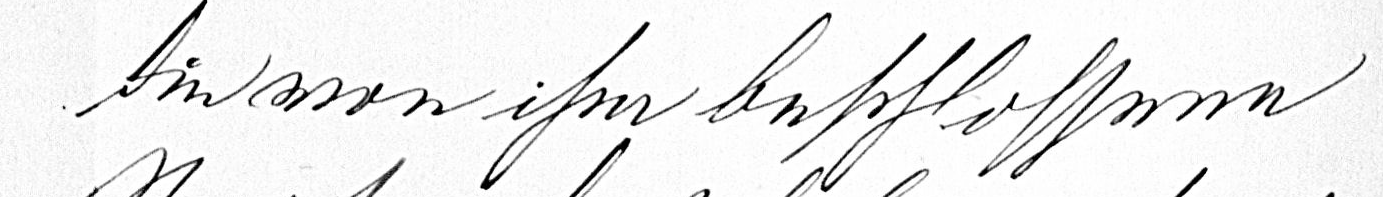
die von ihm beschlossene
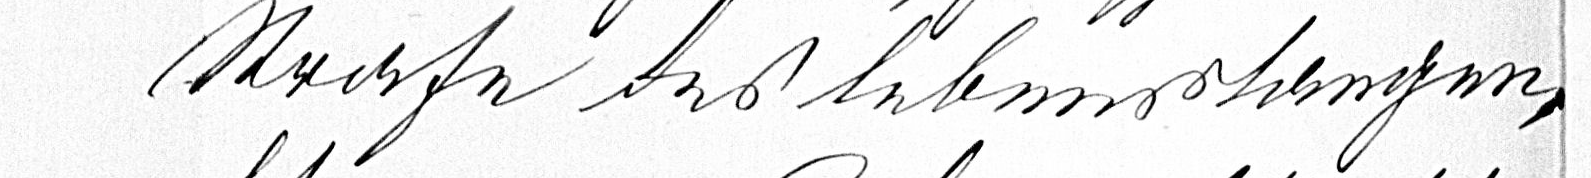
Strafe des lebenslangen,
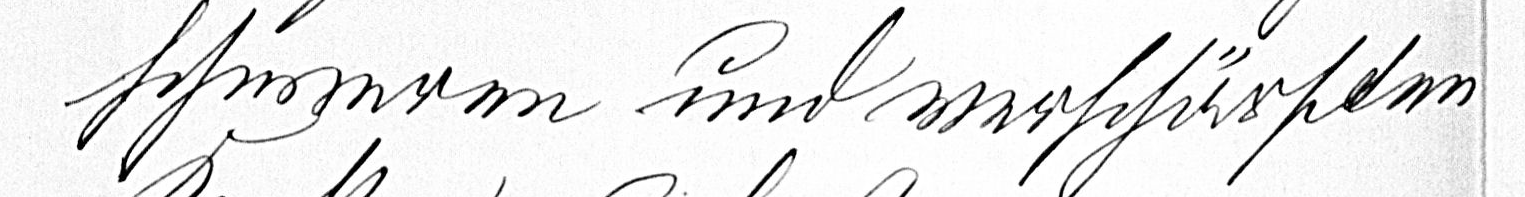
schweren und verschärften
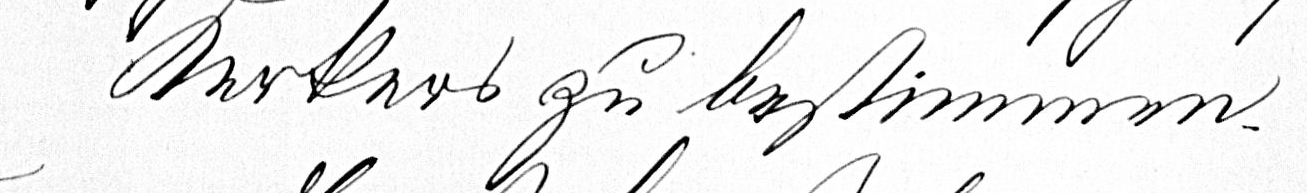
Kerkers zu bestimmen.
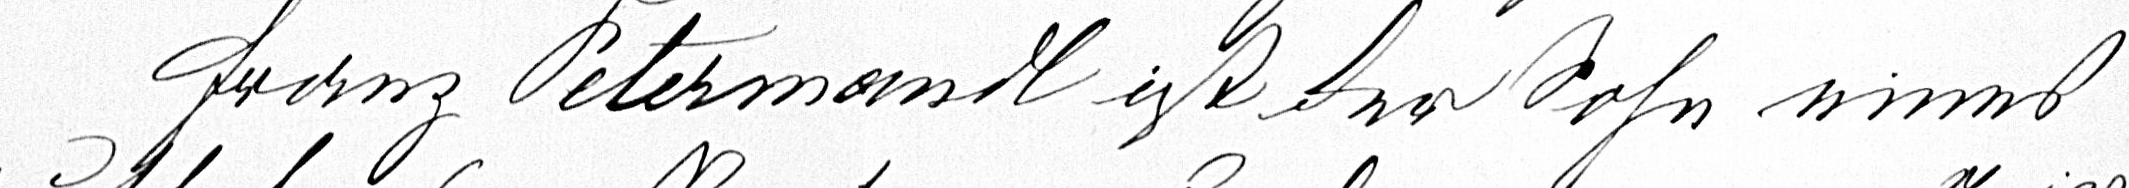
Franz Petermandl ist der Sohn eines
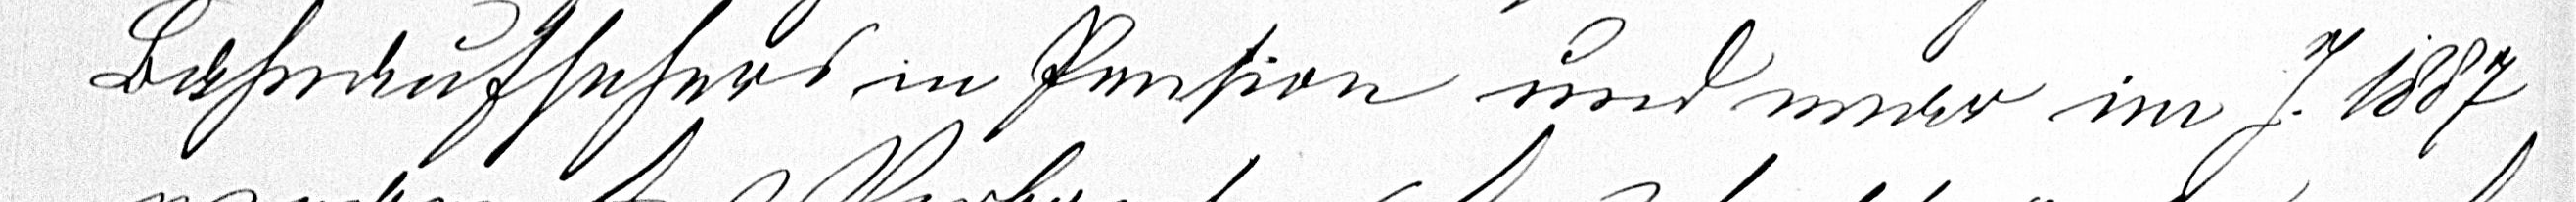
Bahnaufsehers in Pension und war im J. 1887
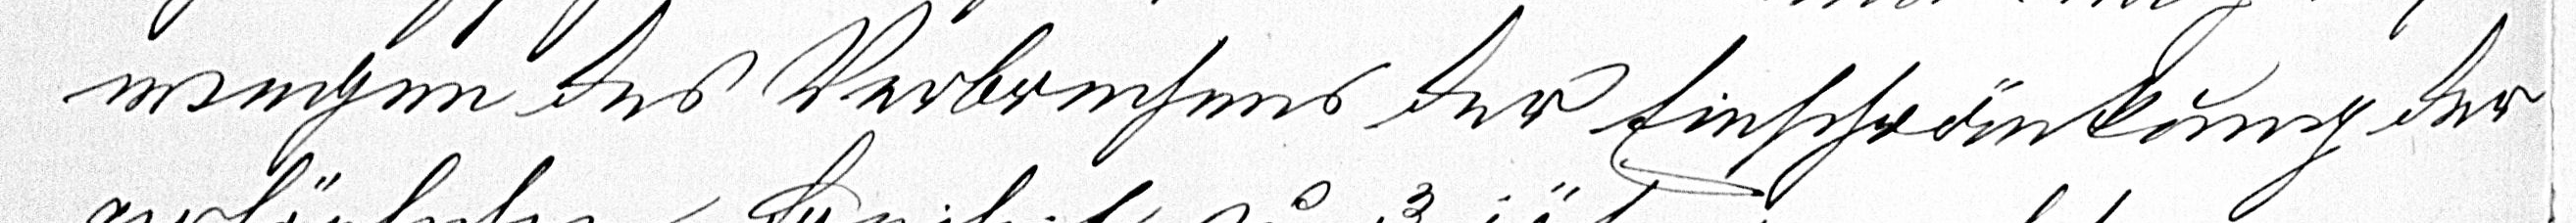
wegen des Verbrechens der Einschränkung der
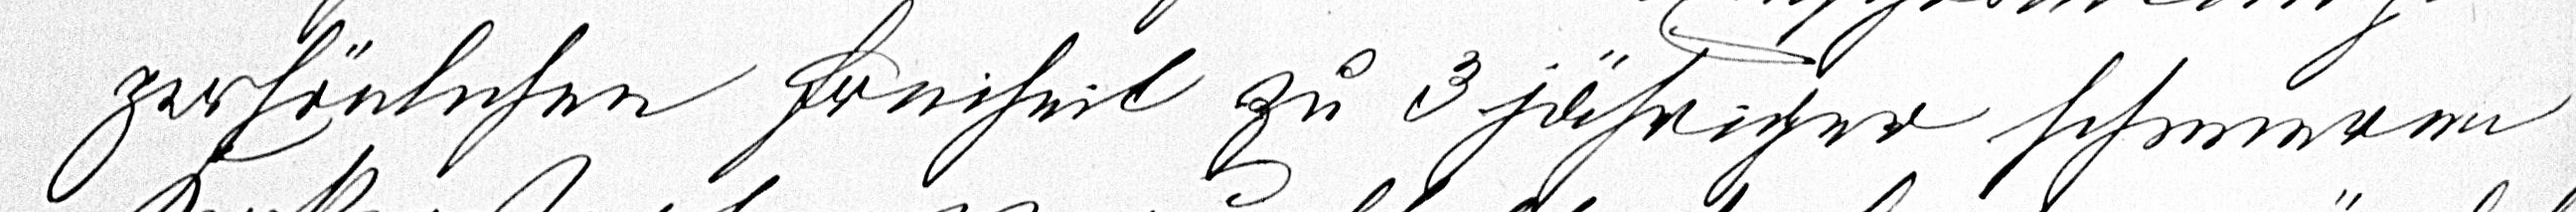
persönlichen Freiheit zu 3 jähriger schweren
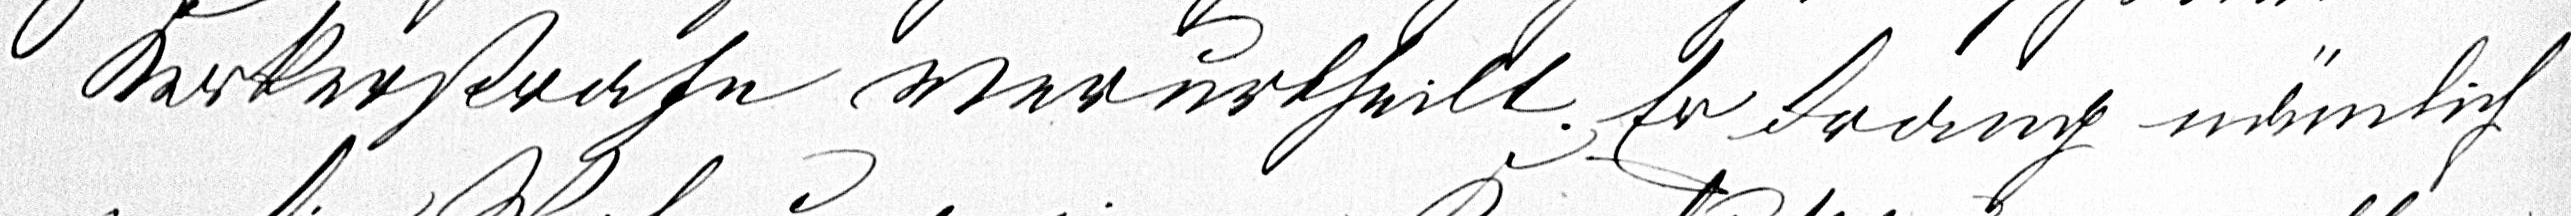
Kerkerstrafe verurtheilt. Er drang nämlich
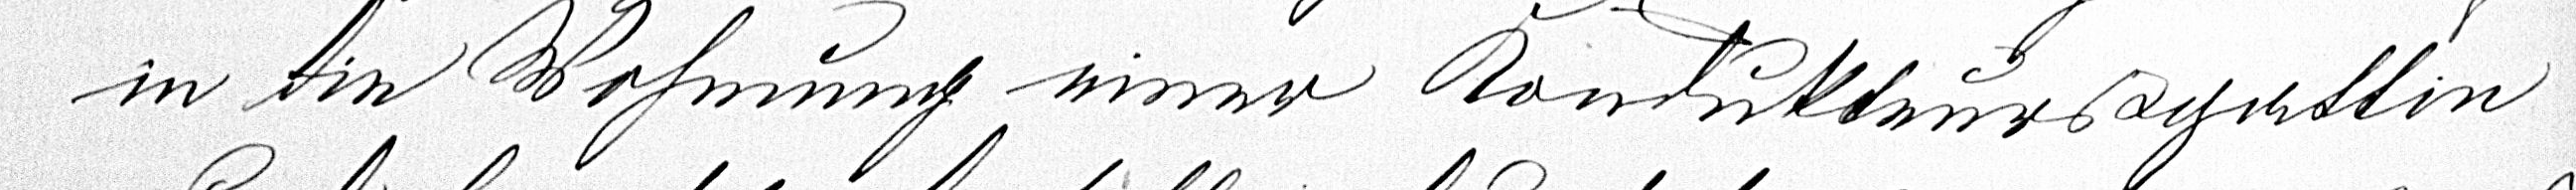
in die Wohnung einer Kondukteursgattin
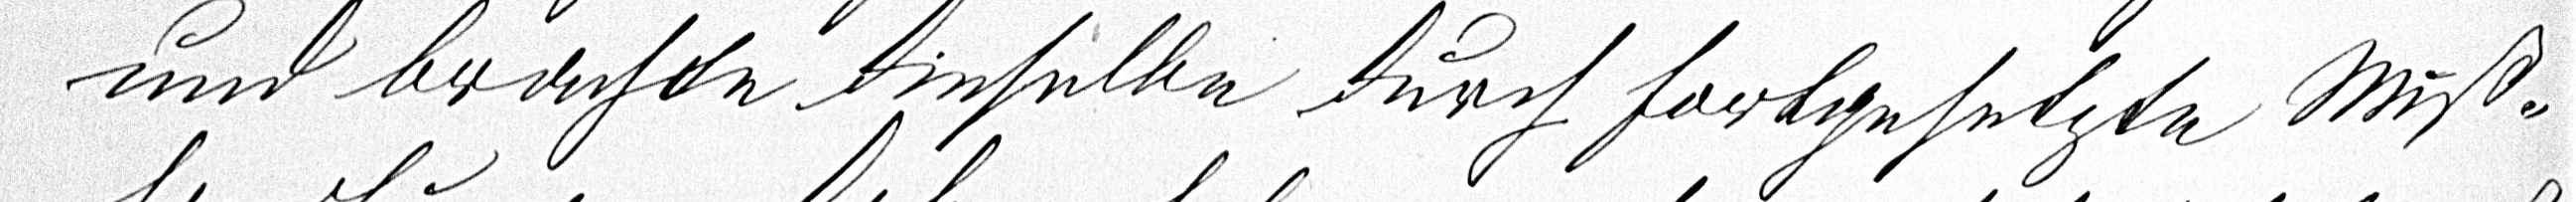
und brachte dieselbe durch fortgesetzte Miß¬
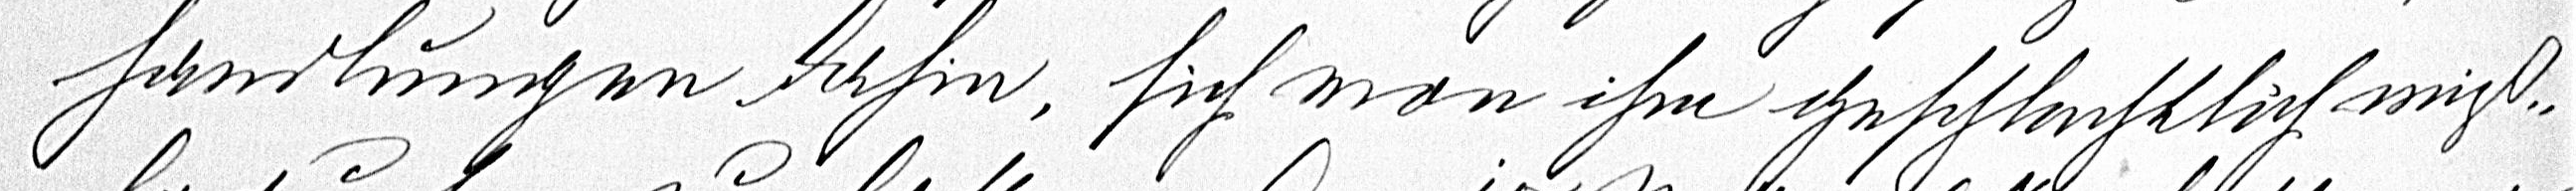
handlungen dahin, sich mon ihn geschlechtlich miß¬
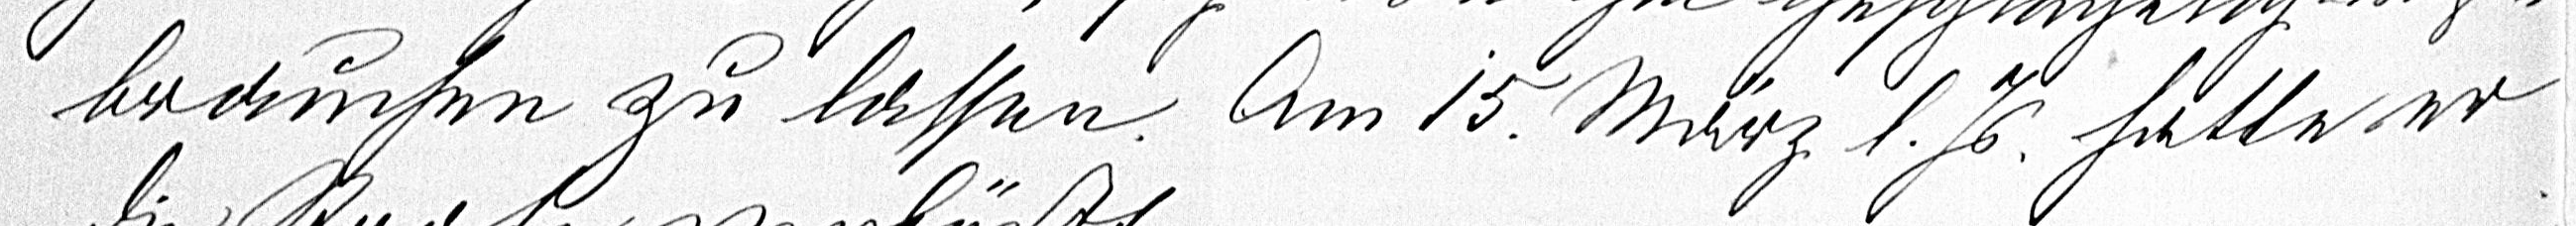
brauchen zu lassen. Am 15. März l. Js. hatte er
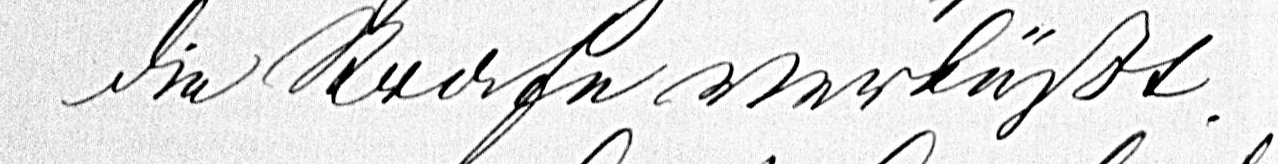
die Strafe verbüßt.
